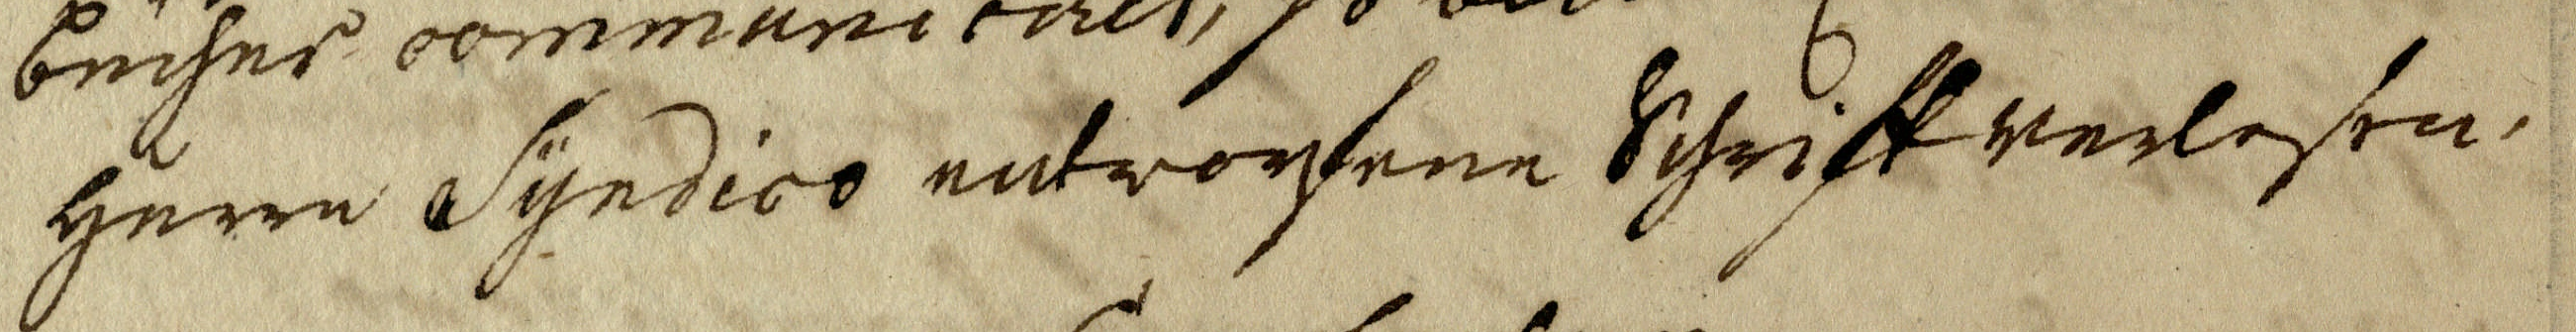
Herrn Sÿndico entworfene Schrift verlesen.
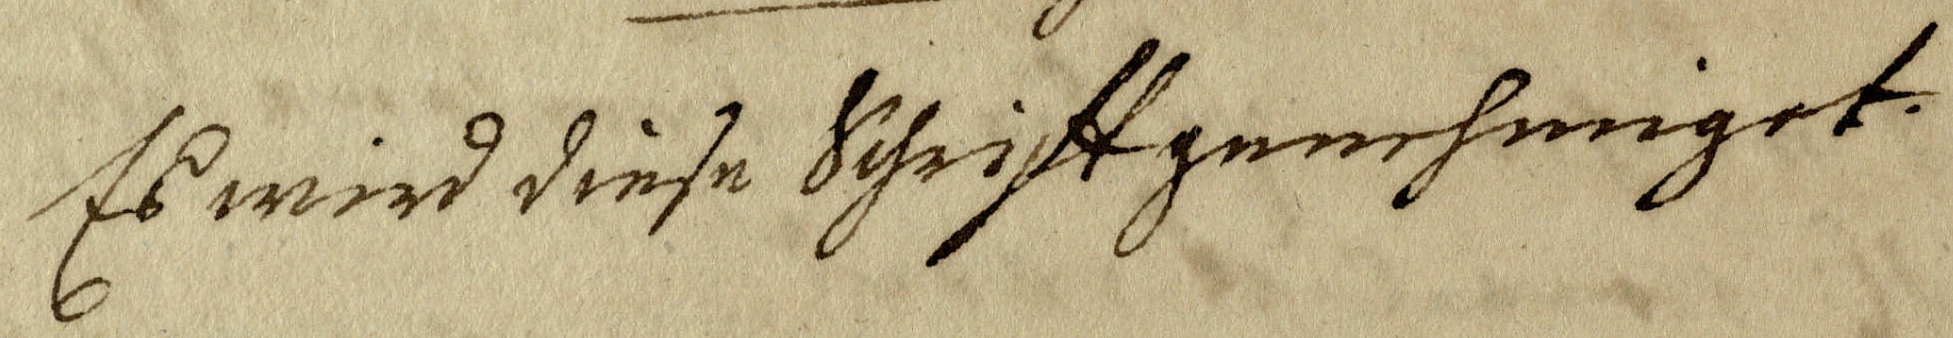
Es wird diese Schrift genehmiget.
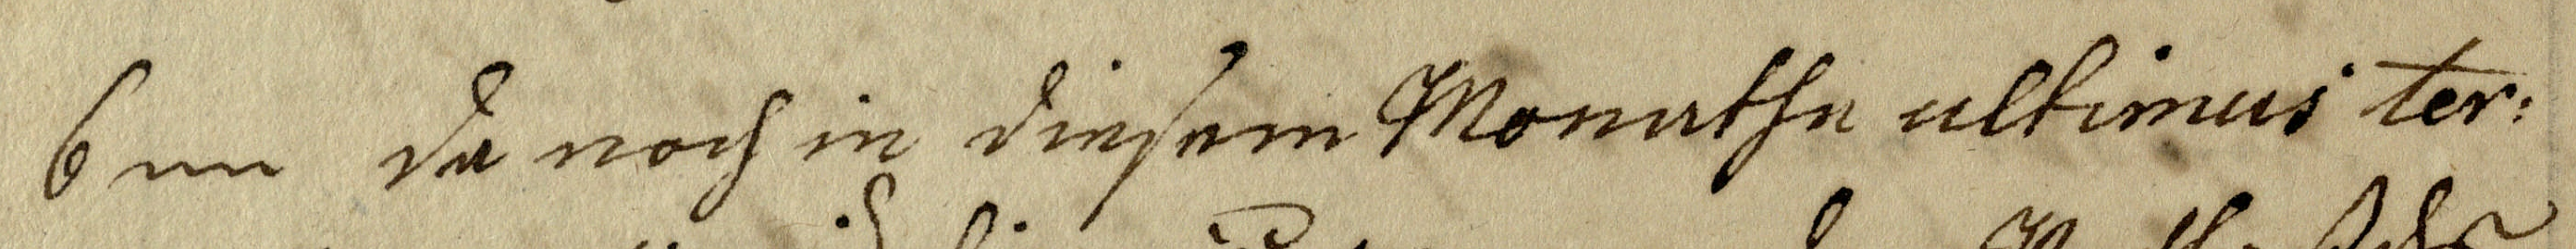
Da noch in diesem Monathe ultimus ter¬
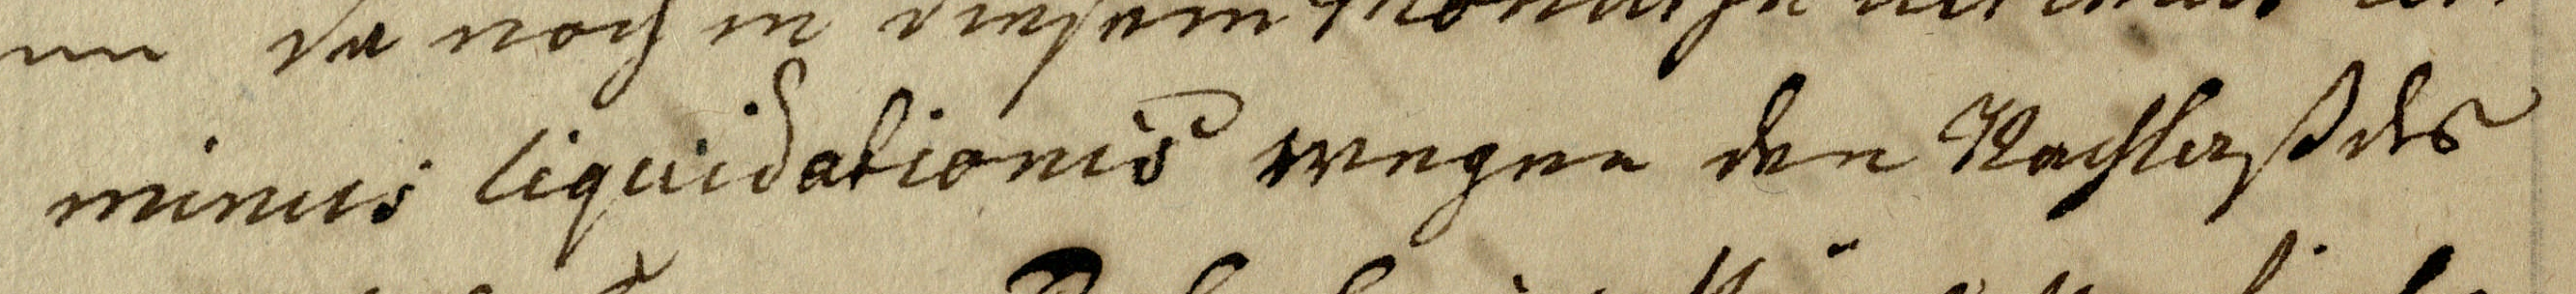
minus liquidationis wegen den Nachlaß des
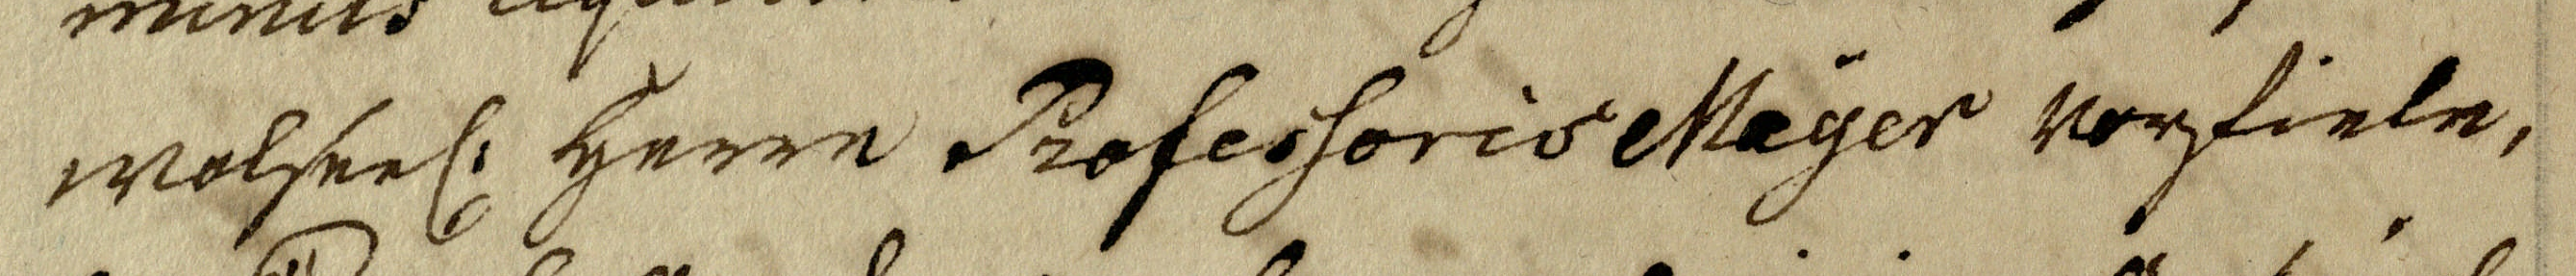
wolseel. Herrn Professoris Maÿer vorfielen,
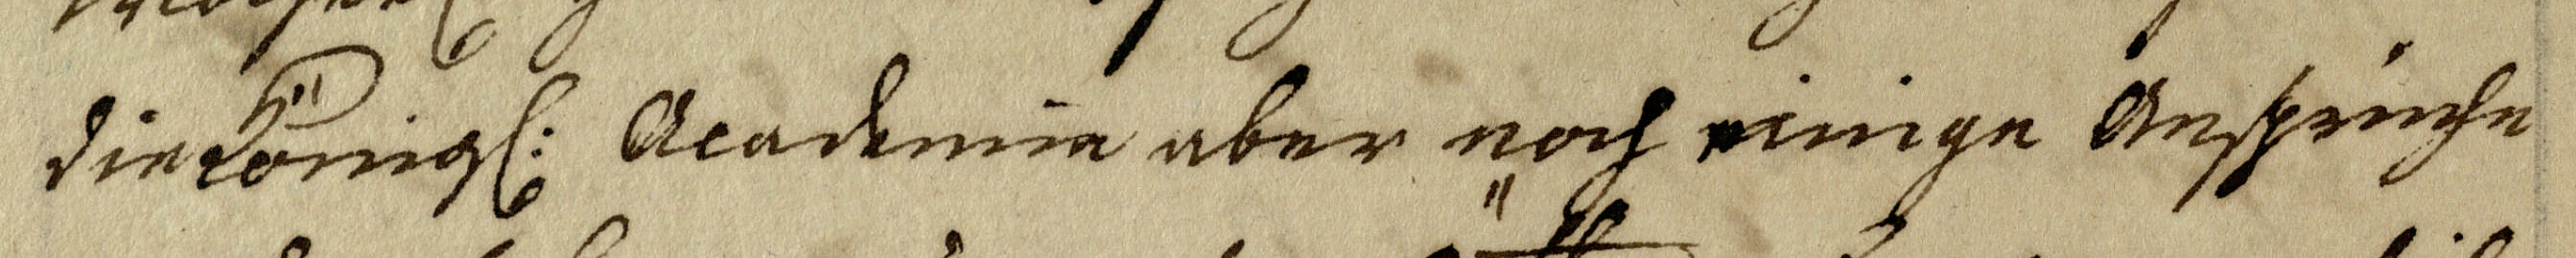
die Königl. Academie aber noch einige Ansprüche
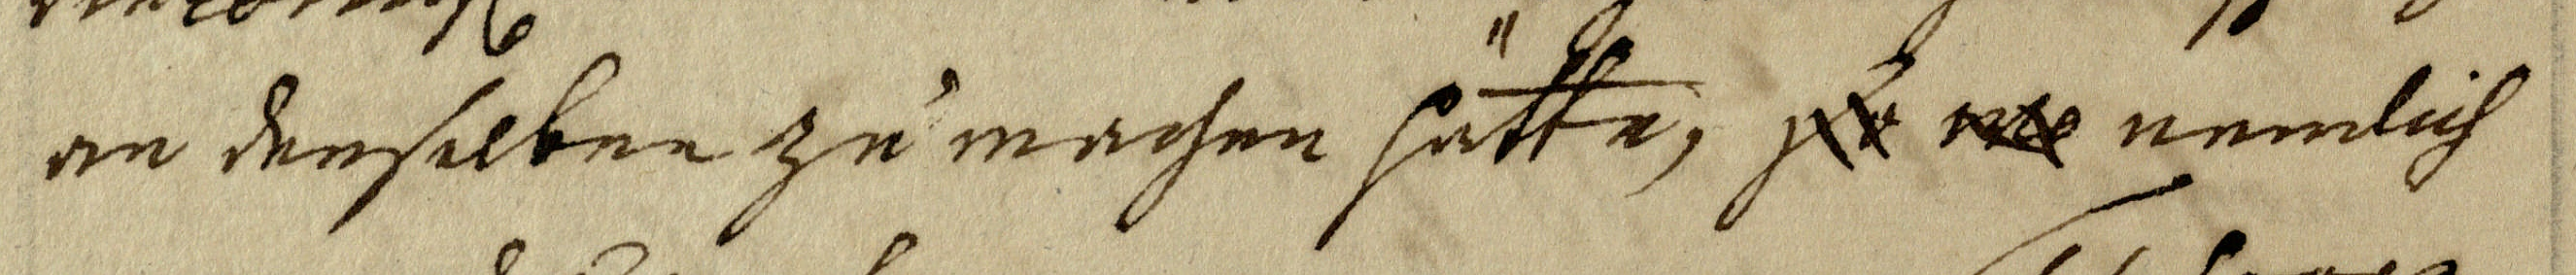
an denselben zu machen hätte, nemlich
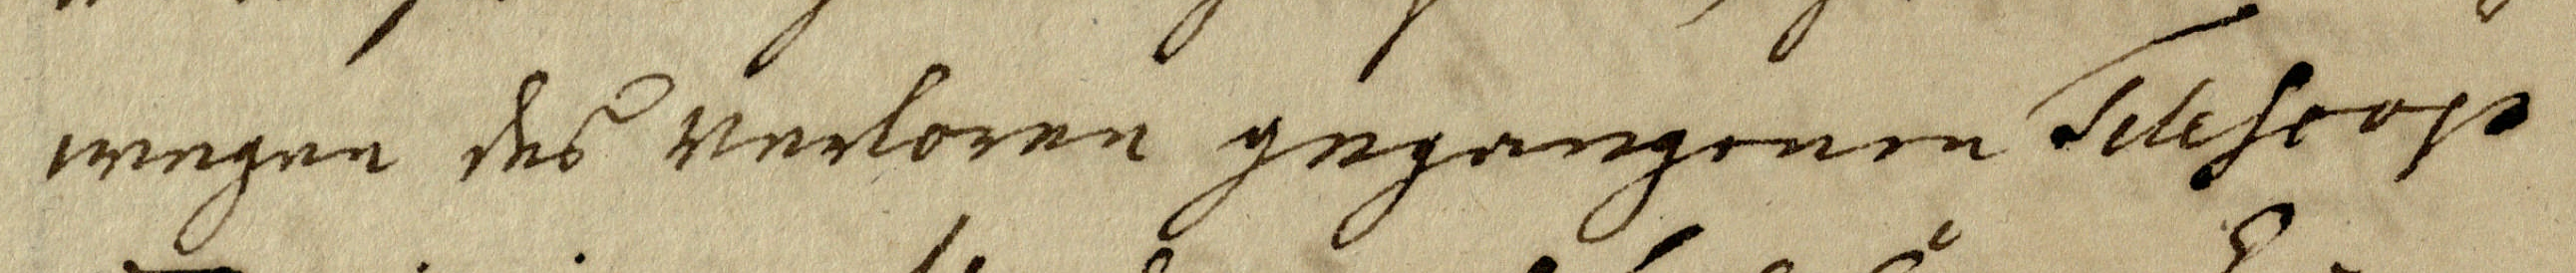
wegen des verloren gegangenen Telescop
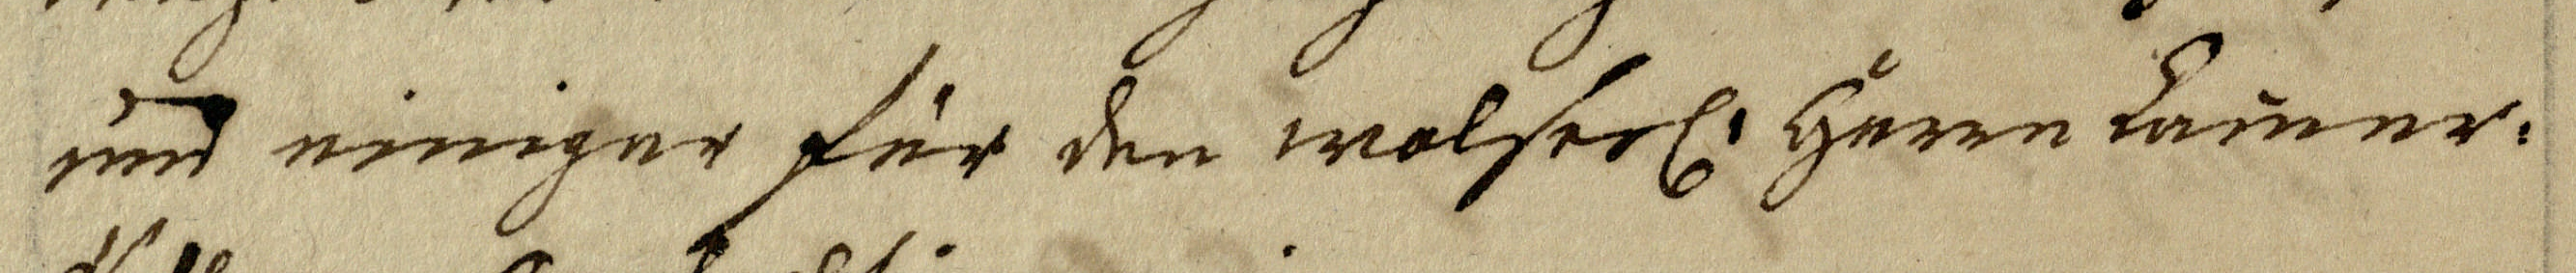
und einiger für den wolseel. Herrn Camer¬
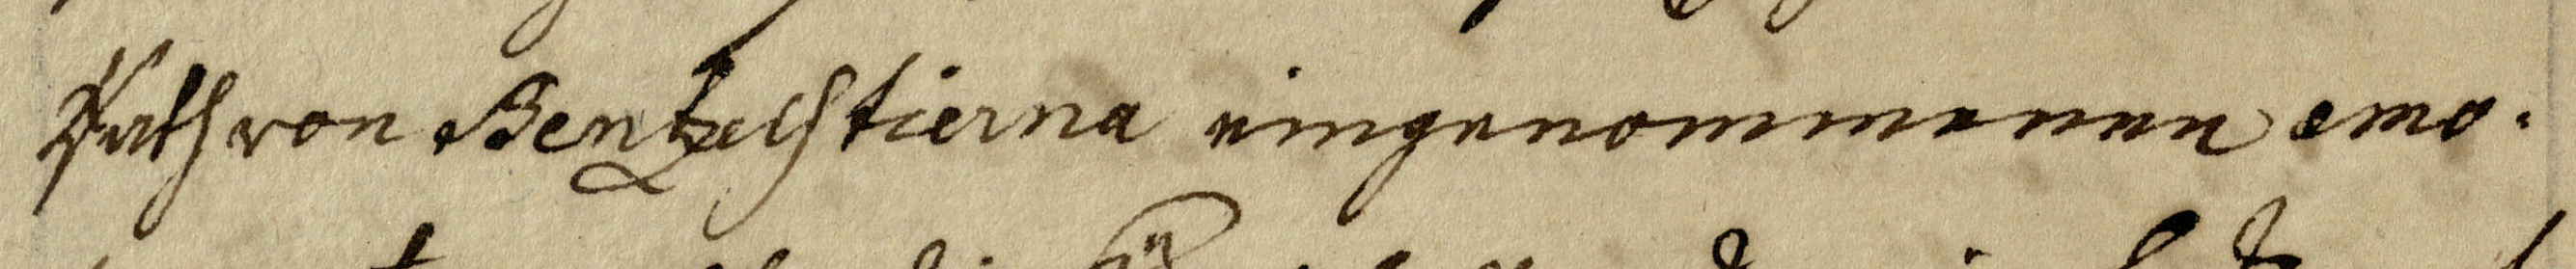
Rath von Bentzelstierna eingenommenen emo¬
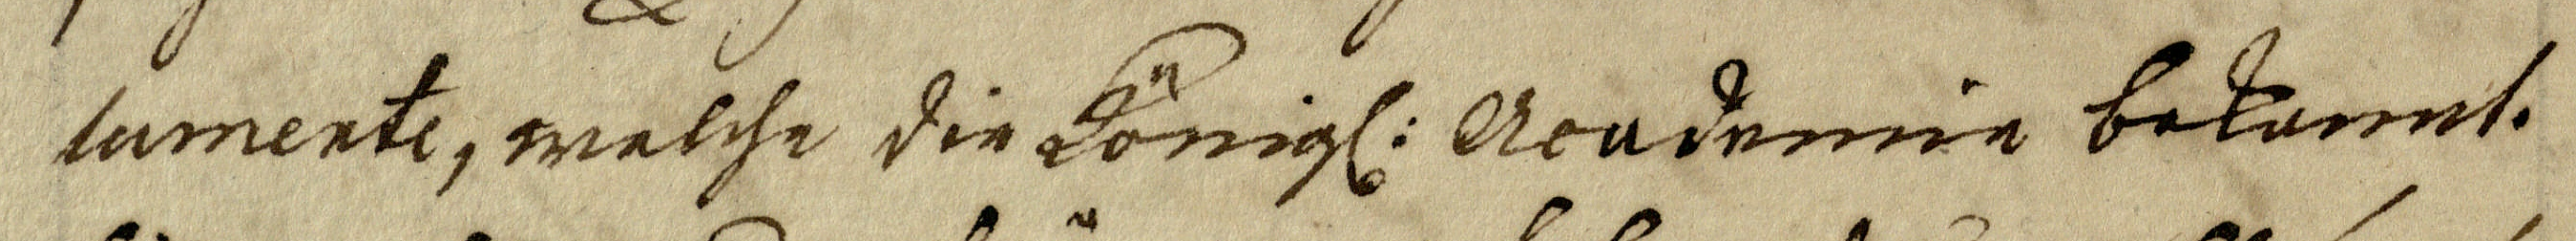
lumente, welche die Königl. Academie bekannt¬
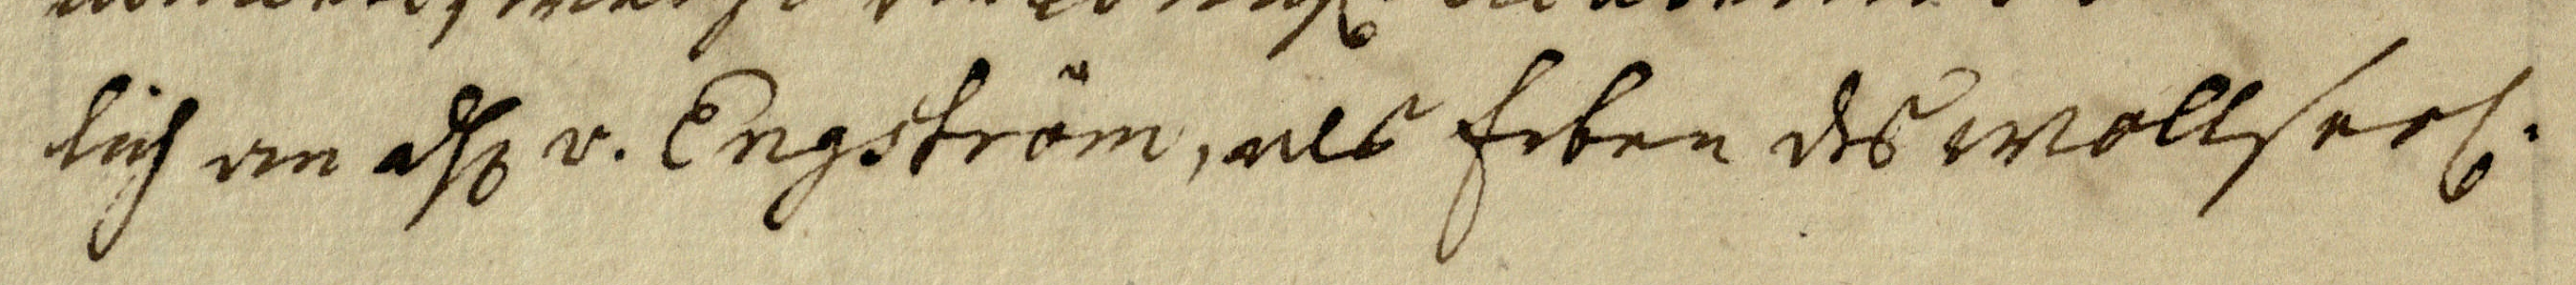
lich an dh. v. Engström, als Erben des wollseel.
